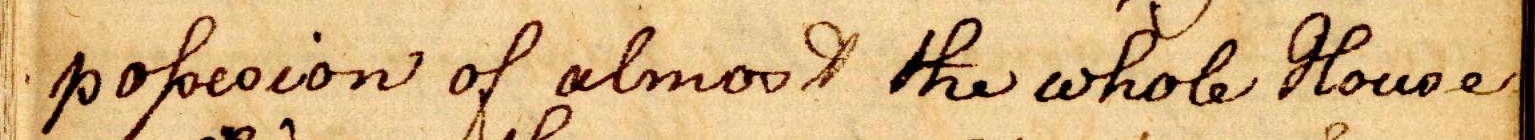possesion of almost the whole House
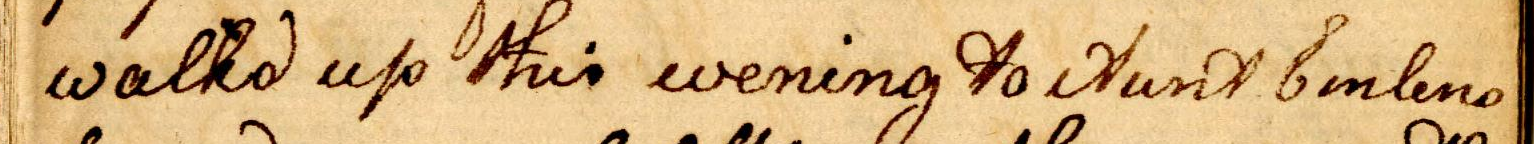walkd up this evening to Aunt Emlens
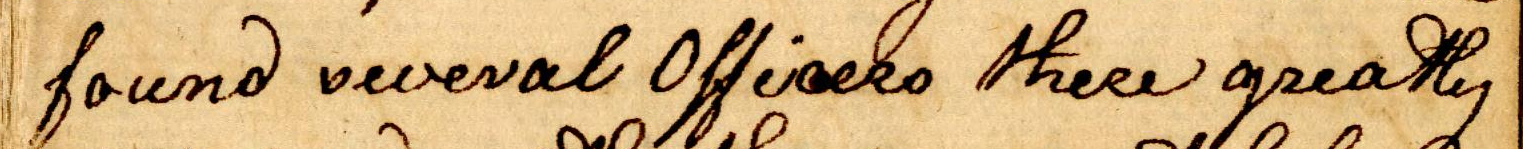found several Officers there greatly
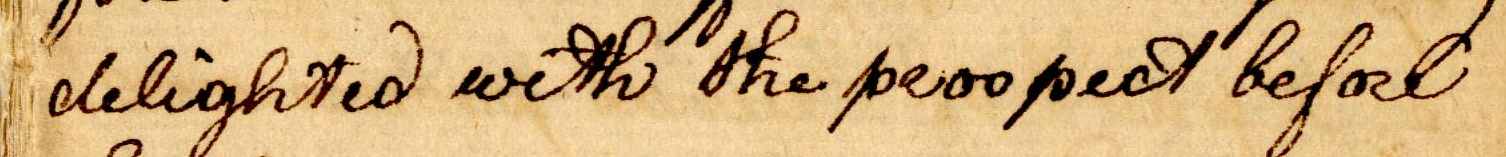delighted with the prospect before
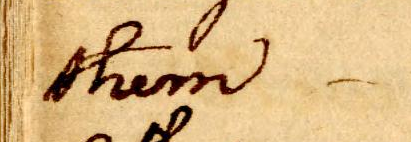them-
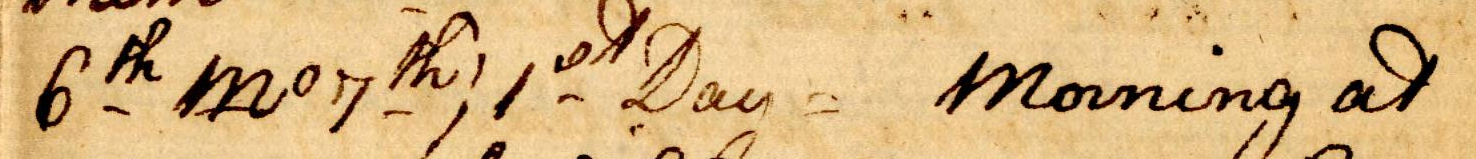6^th M^o7^th) 1^st Day- Morning at
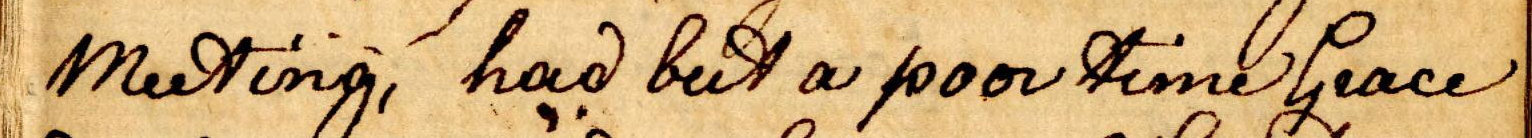Meeting, had but a poor time Grace
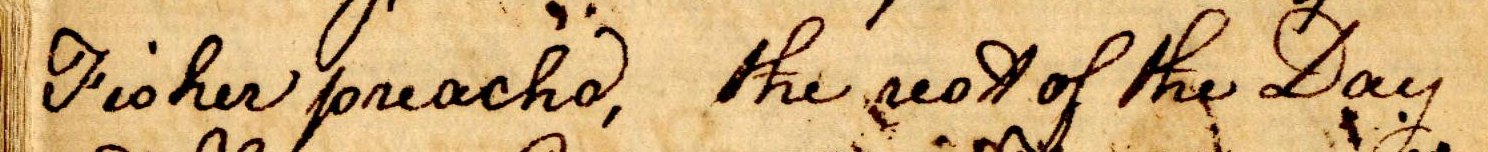Fisher preachd, the rest of the Day
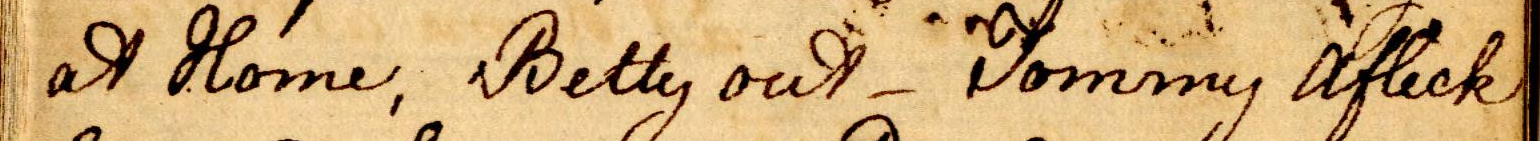at Home, Betty out- Tommy Afleck
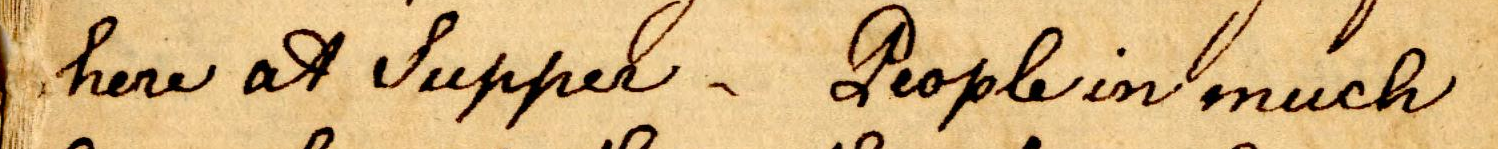here at Supper- People in much
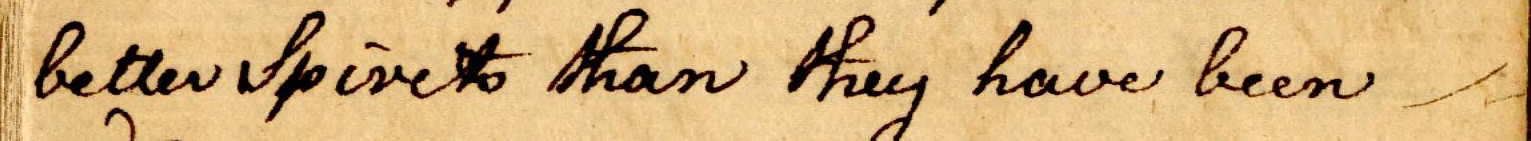better Spirits than they have been-
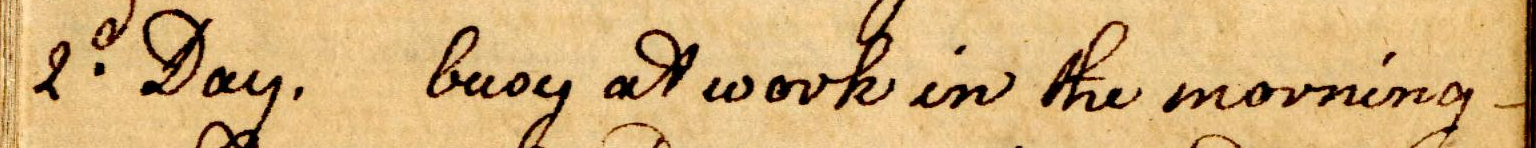2^d Day. busy at work in the morning.
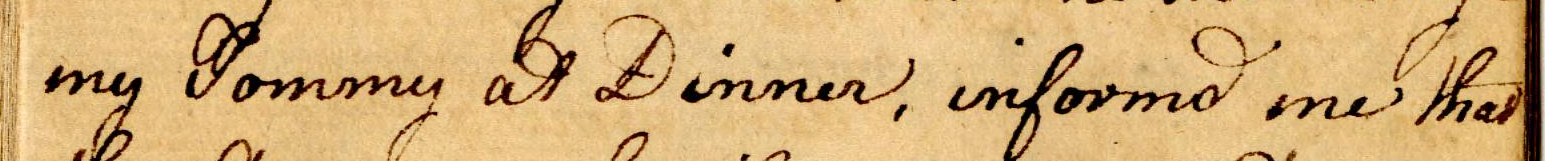my Tommy at Dinner, informd me that
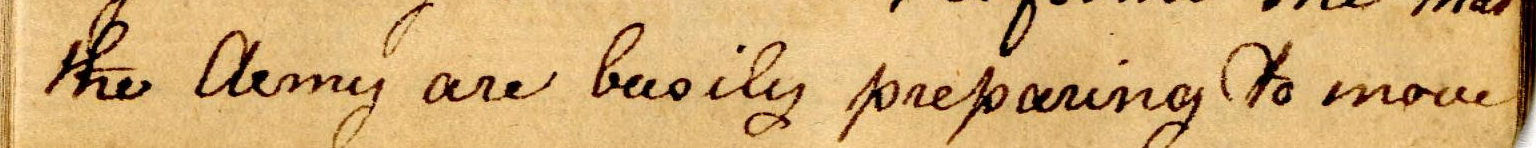the Army are busily preparing to move
